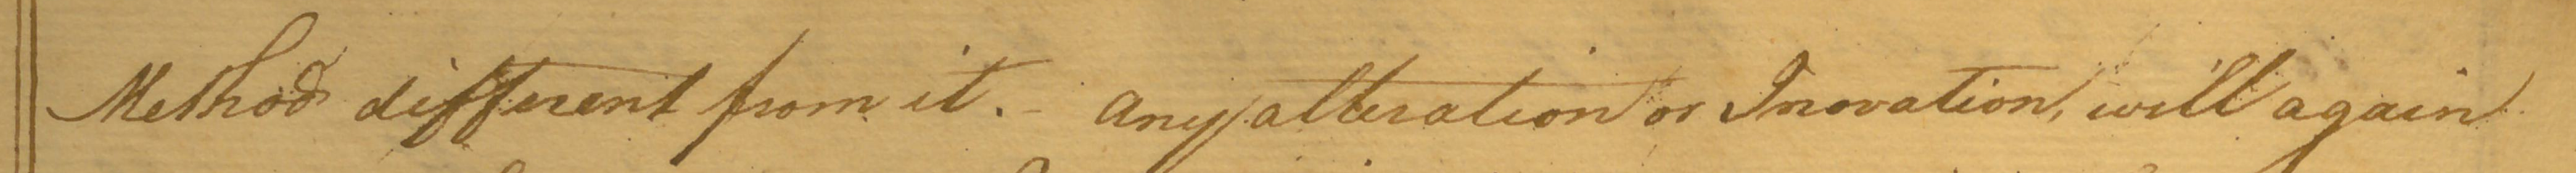Method different from it. Any alteration or Inovation will again
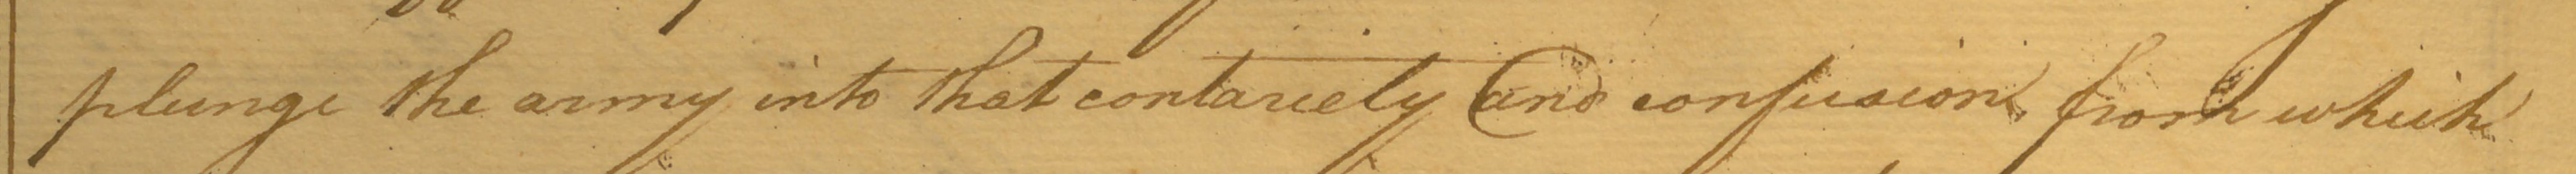plunge the army with that contariety and confusion from which
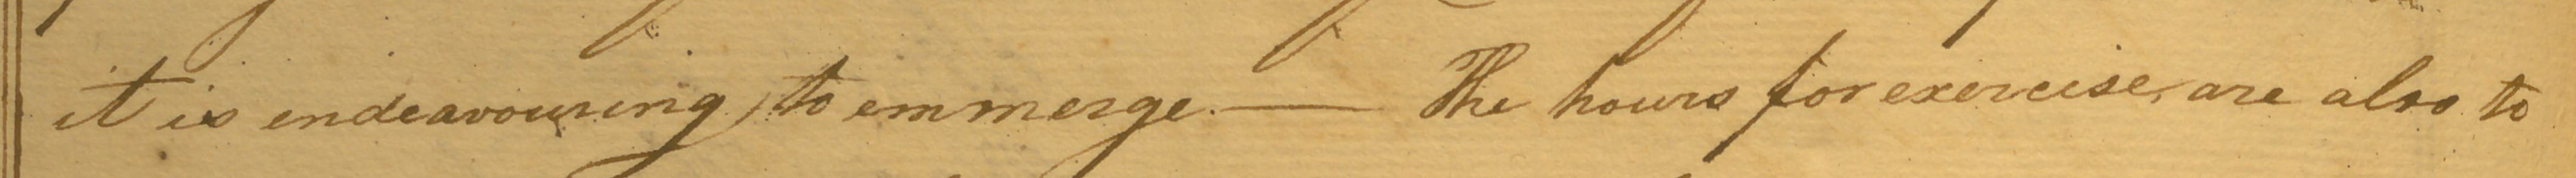it is endeavouring to emerge- The hours for exercise are also to
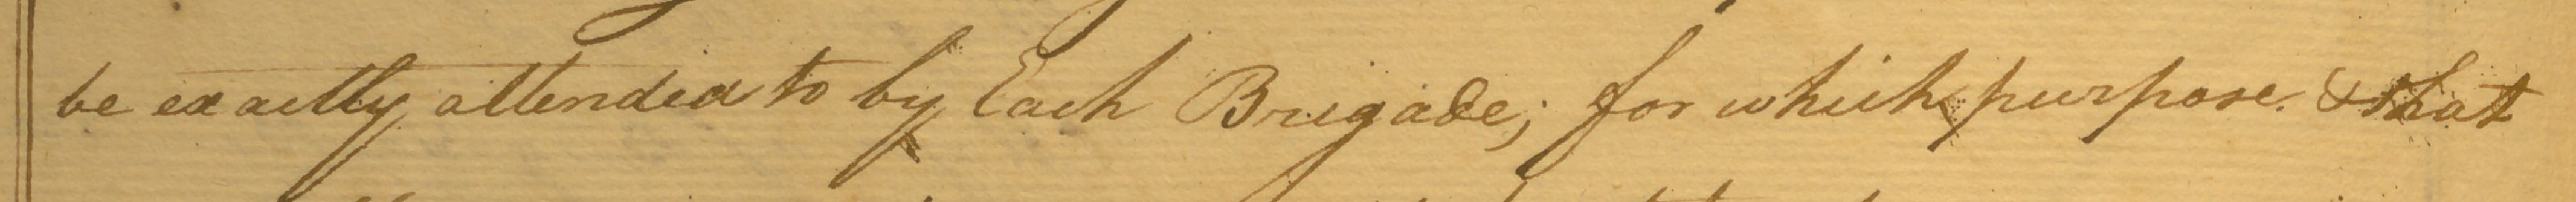be exactly attended to by Each Brigade; for which purpose & that
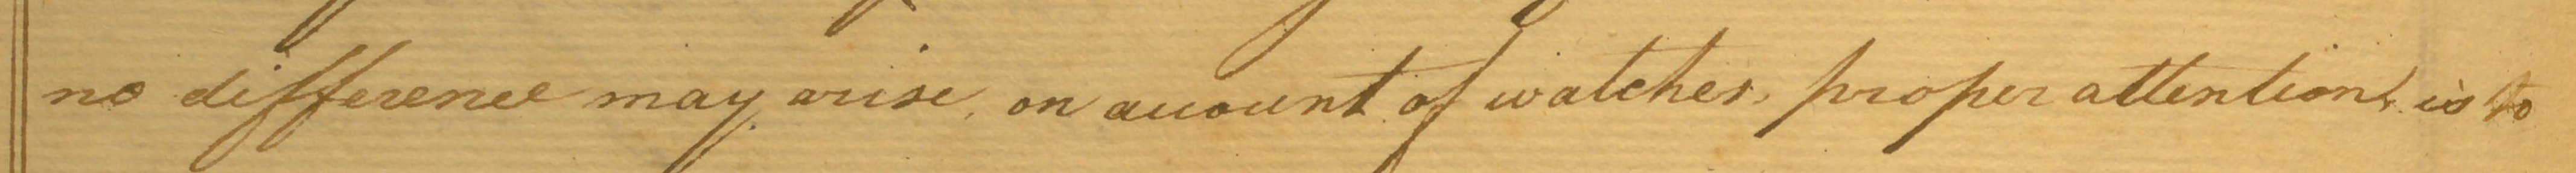no difference may arise on account of watches proper attention is to
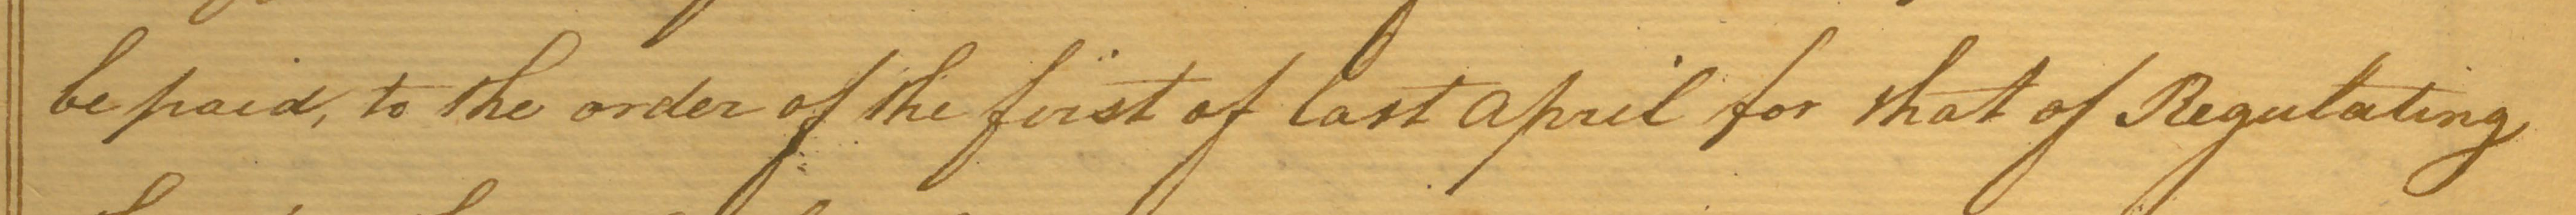be paid to the order of the first of last April for that of Regulating
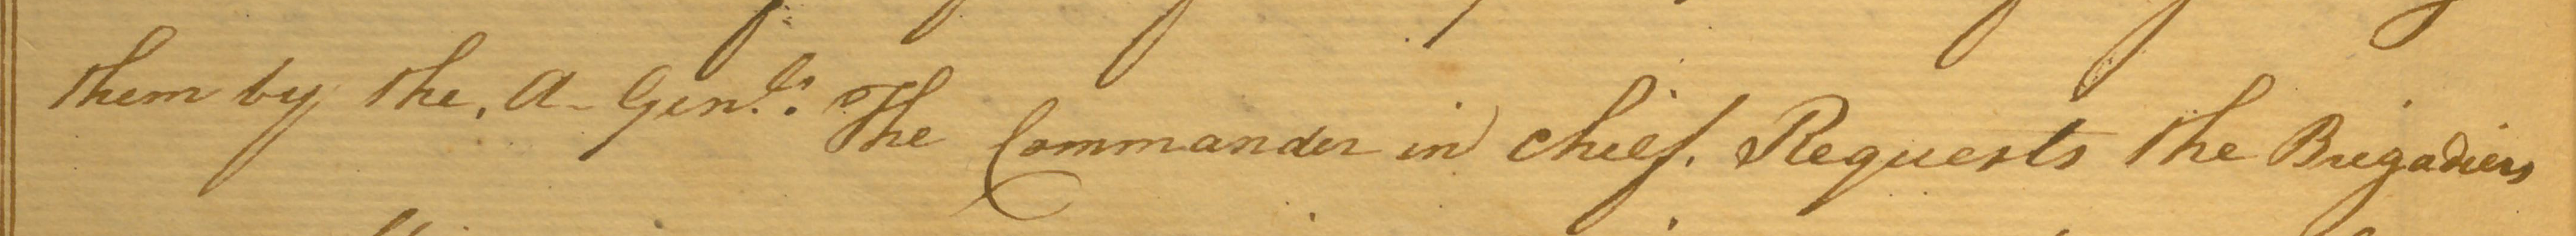them by the A- Gen^l.: The commander in chief Requests the Brigadiers
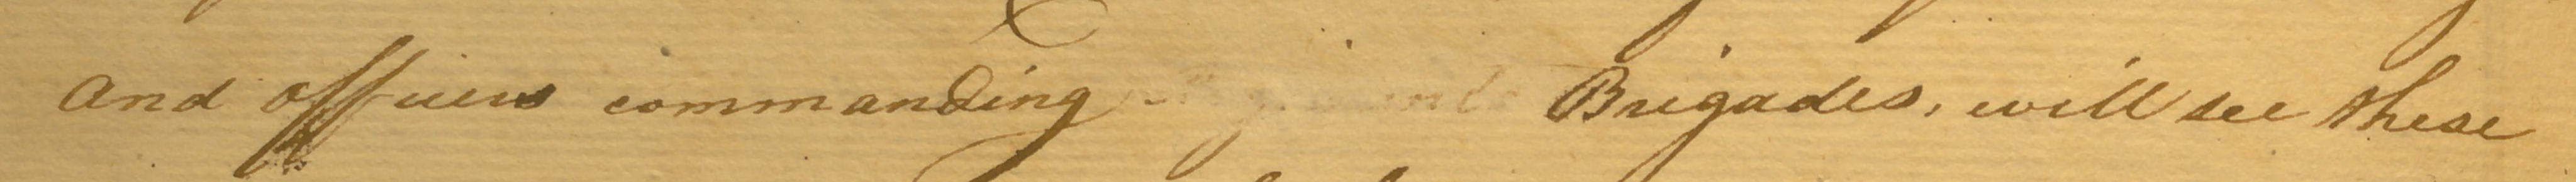and officers comanding [Regiments] Brigades will see these
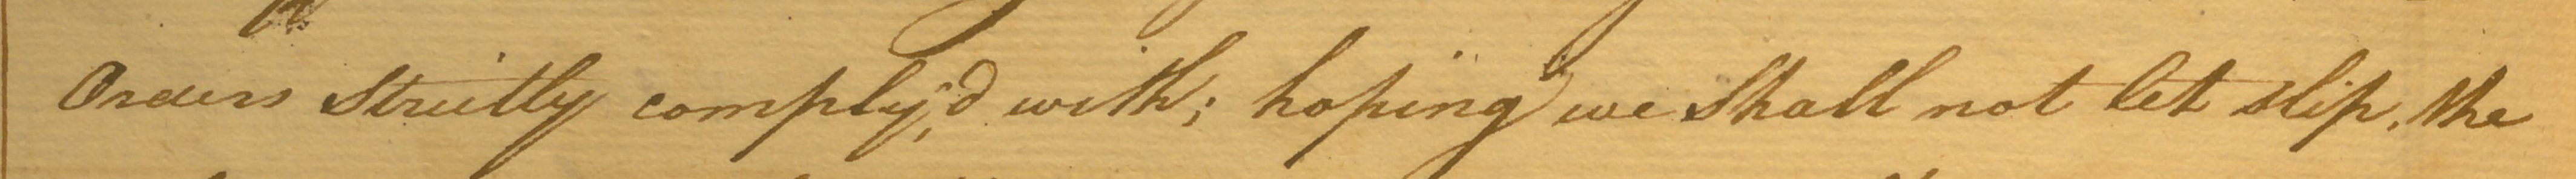Orders Strictly comply'd with; hoping we Shall not let slip the
